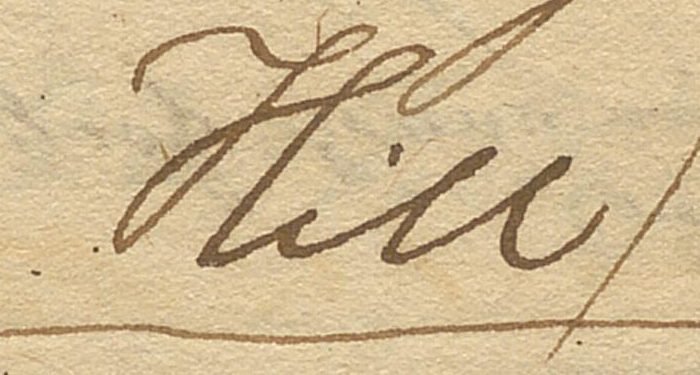Hill
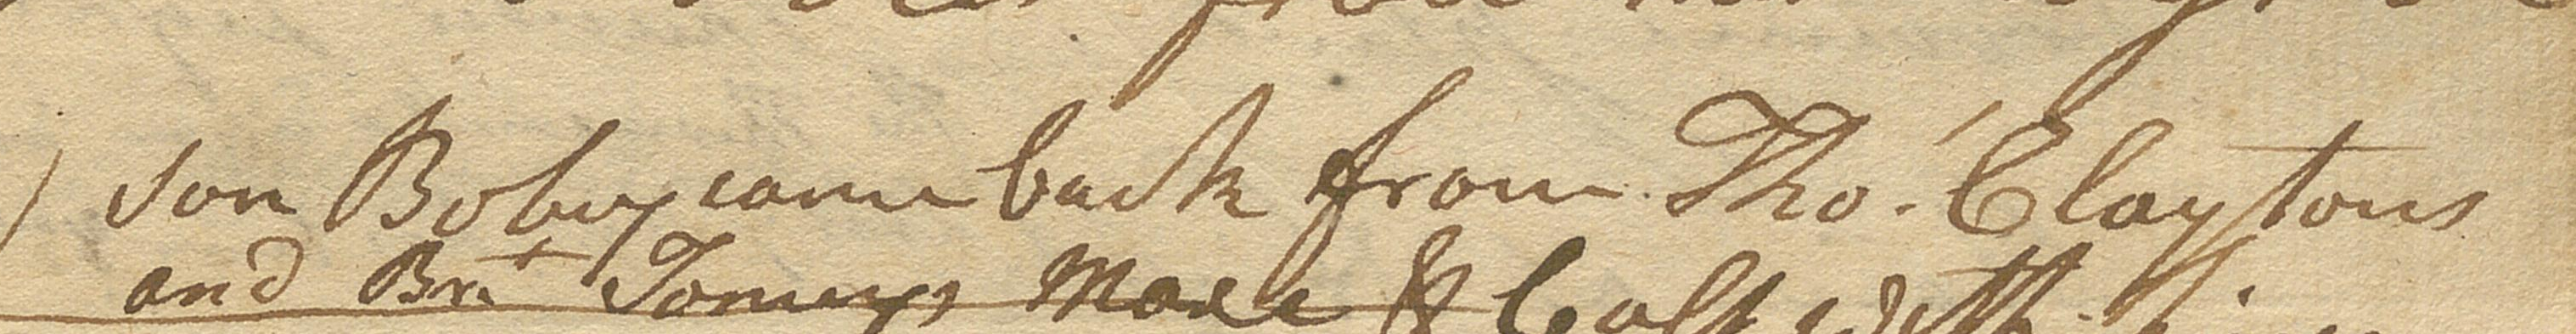son Bobey came back from Tho^s. Claytons
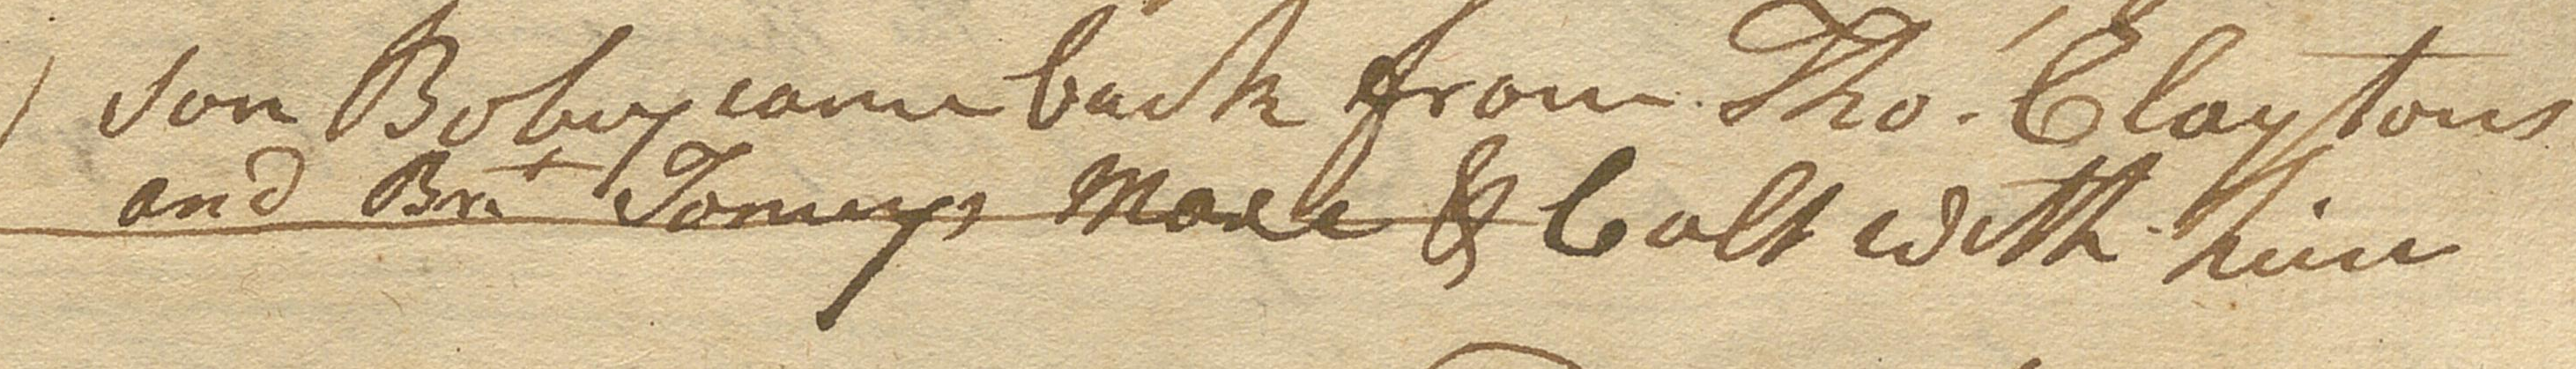and Br^t. Tomeys Mare & Colt with him
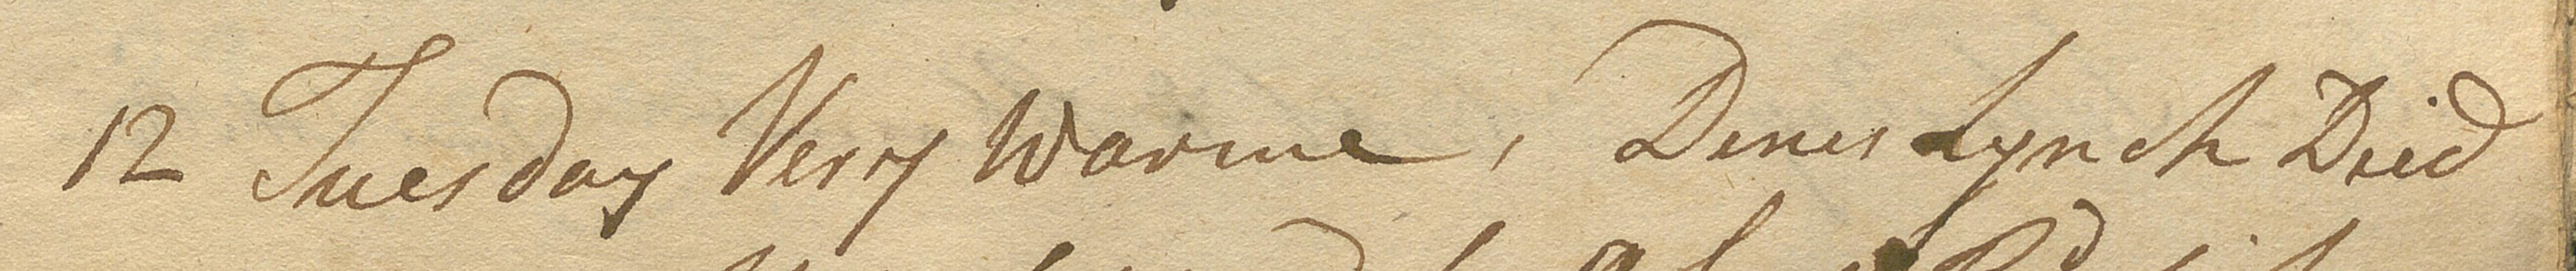12 Tuesday Very Warme, Dines Lynch Died
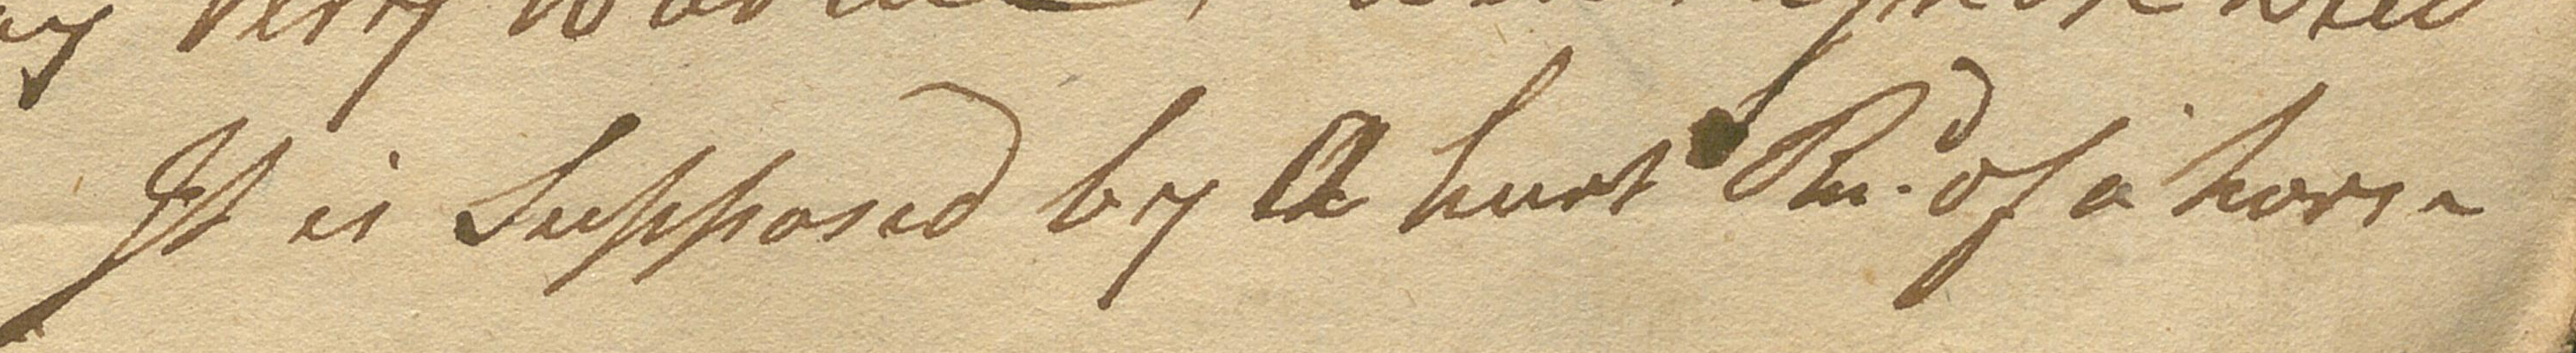It is Supposed by A hurt Rec^d. of a horse
